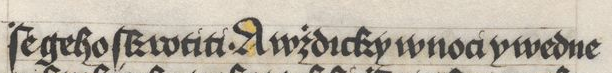ẛe gſeho ſkrotiti. A vżdickY w noci y wedne
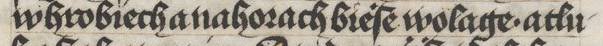whrobíech a nahorach bIeẛe Wolage.a tlu¬
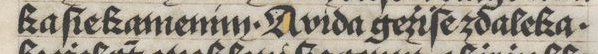ka ſie kamenÍm. A vida geżíẛe zdaleka.
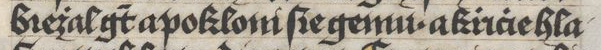bíeżal ḡt a poklonI ſie gemu. a kṙiċie hla¬
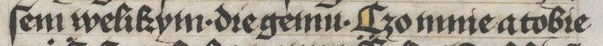ſem welikym.díe gemu.Czo mnie a tobie
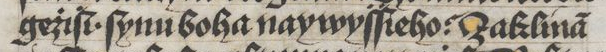geżiẛi.ſynu boha naywyẛſíeho?Zaklinā
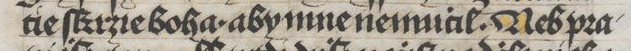tie ſkrzie boha.aby mne nenuċil.Neb pra¬
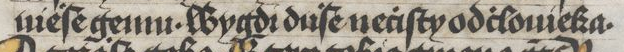wieẛe gemu.Wygdi duẛe neċiſty odċlowieka.
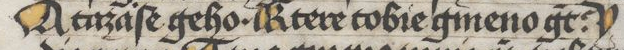A tazaẛe geho.Ktere tobie gmeno ḡt?Y
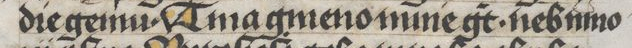díe gemu.Tma gmeno mnie ḡt.neb mno¬
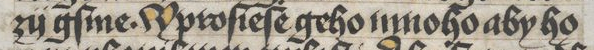zu gſme.Y proſieẛe geho mnoho aby ho¬
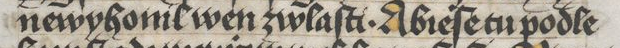newyhonil wen zwlaſti.A bieẛe tu podle
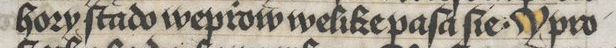hozy ſtado wepṙow welike paſa ſie.Y pro¬
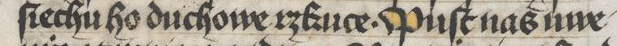ſiechu ho duchowe rzkuce.Puſt nas uwe¬
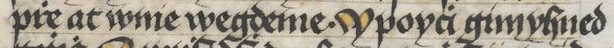pṙe at wnie wegdeme.Y poyċi gím yhned
